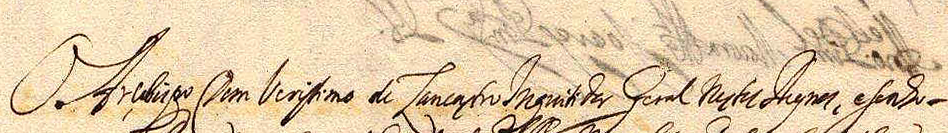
O Arcebispo Dom Verissimo de Lancastro Inquisidor Geral nestes Reynos, e senho
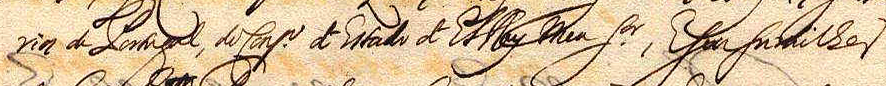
rios de Portugal, do Cons.o de Estado de El Rey meu s.or, E seu sumilher
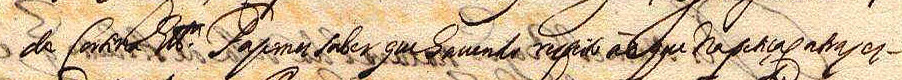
de Cortina Ett.a Fazemos saber que hauendo respeito ao que na petiçaꝭ atras es
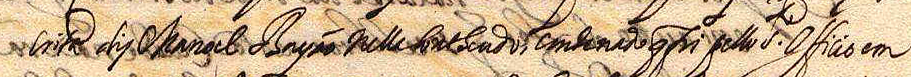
crita dis Manoel Bayaõ nelle contheudo, condenado q̄ foi pello s.to Officio em
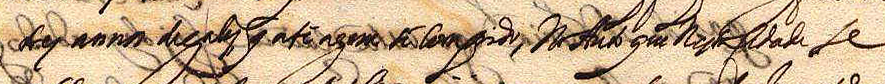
trez annos de gales, q̄ ate agora tē comprido, no Auto que nesta Cidade se
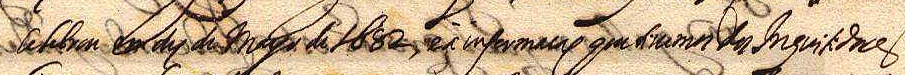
celebrou em dez de Mayo de 1682, e a informaçaꝭ que tiuemos dos Inquisidores
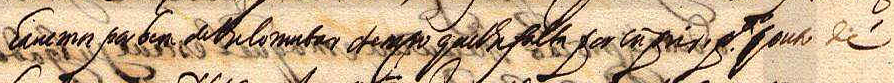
hauemos por bem de lhe comutar tempo que lhe falta por cūprir, p.a Couto de
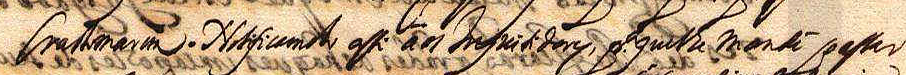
Crasto marim. Notificando assi aos Inquisidores, p.a que lhe mandē passar
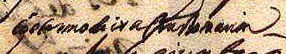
cō o termo de ir a Castro marim
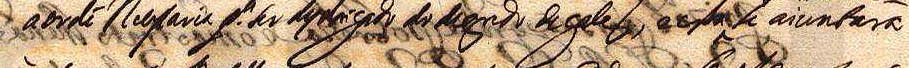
a ordē Necesaria p.a ser desobrigado do degredo de gales, e esta se aiuntara
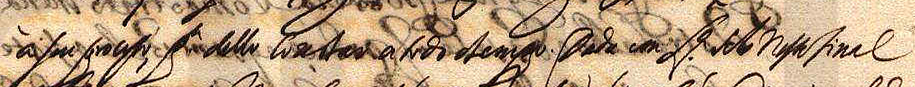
a seu processo, p.a dello constar a todo o tempo. Dada em Lx.a sob nosso sinal
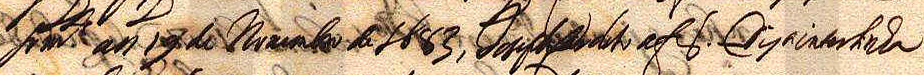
som.te aos 19 de Nouembro de 1683, Ioseph Cardoso a fes. Dis a interlinha
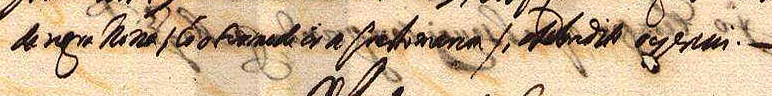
de regra nona / cō o termo de ir a Crasto marim /, o sobredito o escreui.
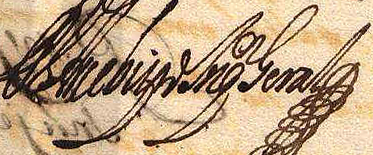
O Arcebispo Inqor Geral
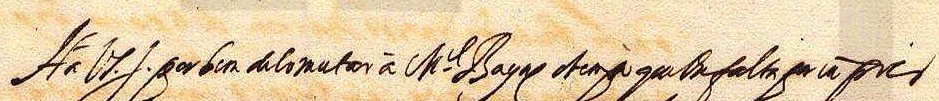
Há VS. J. por bem de comutar a M.el Bayaꝭ o tempo que lhe falta por cūprir
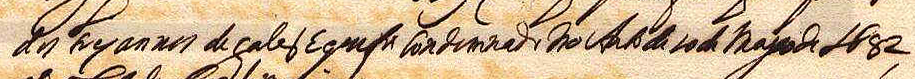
dos tres annos de gales E que foi condemnado no Auto de 10 de Mayo de 1682,
